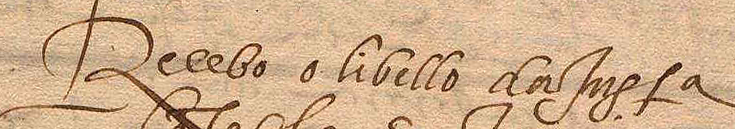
Recebo o libello da Justa
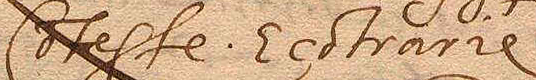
Cōteste. E cōtrarie
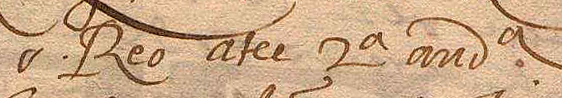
o Reo atee 2a auda.
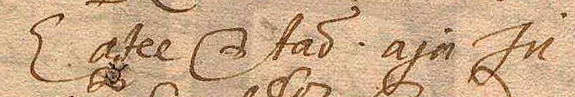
E atee ētaõ. aja Ju
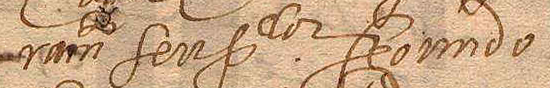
ramto seu pdor segundo
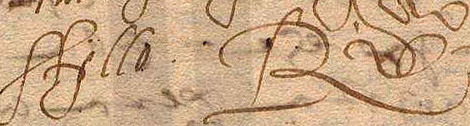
stjllo. R. S.
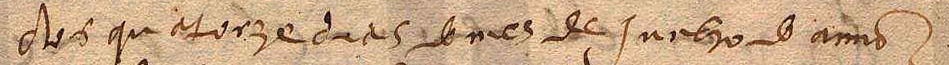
Aos quatorze dias do mes de Junho do annō
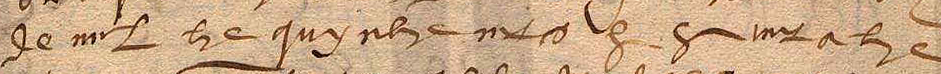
de miL he quynhemtos he sesenta he
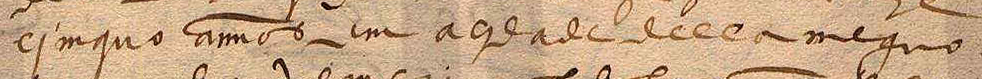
cjmquo ann̄os em a cjdade de llameguo
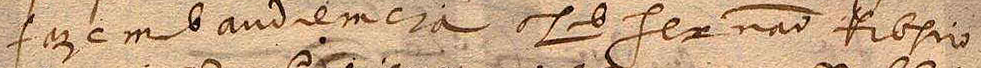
fazemdo audiemcia o Ldo fernão Ribeiro
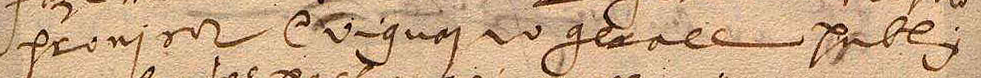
proujsor e viguajro gerall publy
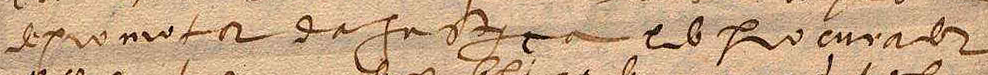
de promotor da Justjça e do procurador
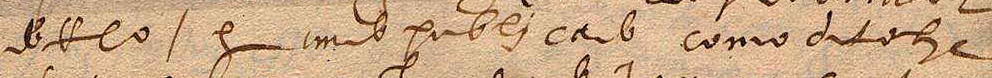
do Reo / himdo publjcado como dito he
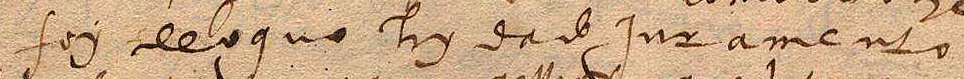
foy lloguo hy dado Juramento
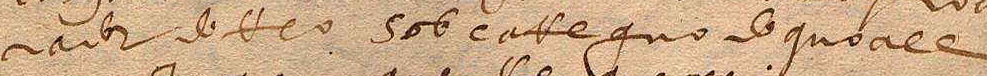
rador do Reo sob caReguo do quoall
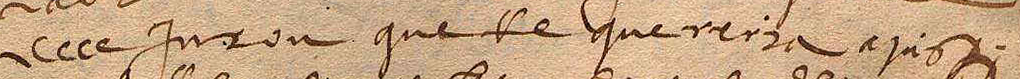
elle Jurou que Requereria a justj
